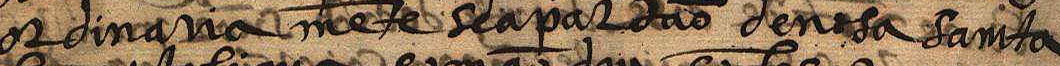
ordinariamēte se apartão de nosa samta
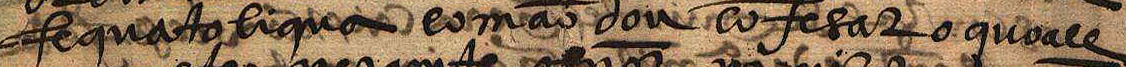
fe quatoliqua e o mãodou c̄ofesar o quoall
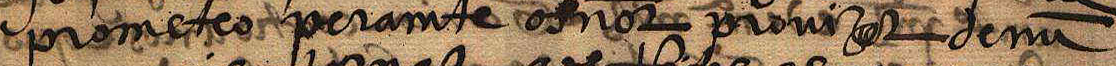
prometeo peramte o snōr prouizor de nū
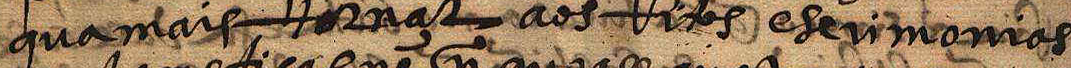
qua mais tornar aos Ritos e serimonias
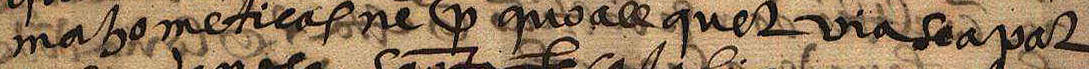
mahometicas nē p̄o quoallquer via se apar
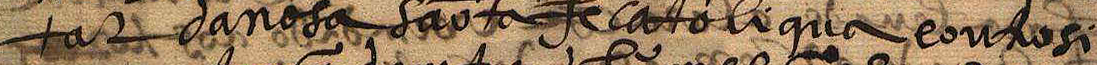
tar da nosa sãota fe catoliqua e outrosi
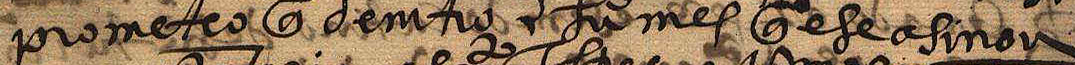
prometeo q̄ demtro ē hū mes q̄ lhe asinou
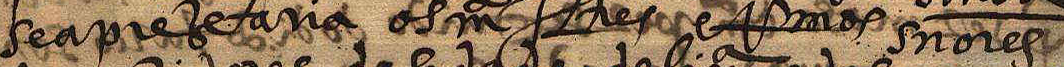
se aprezētaria os mto JLtres e Rmos snōres
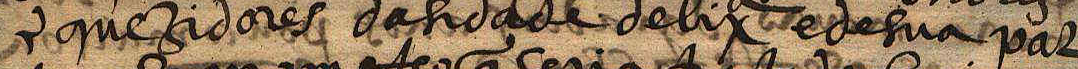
ēquezidores da sidade de lixa e de sua par
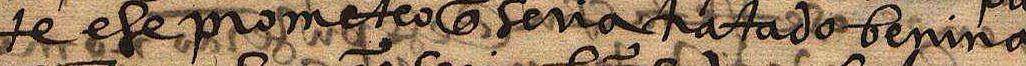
te lhe prometeo q̄ seria tratado benina
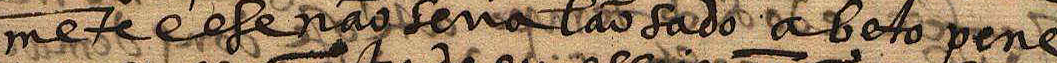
mēte e lhe não seria lãosado abeto pene
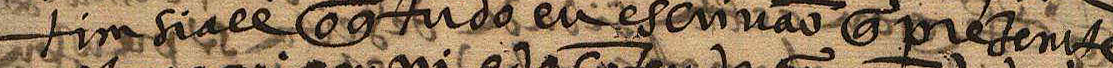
timsiall o q̄ tudo eu escriuão q̄ prezemte
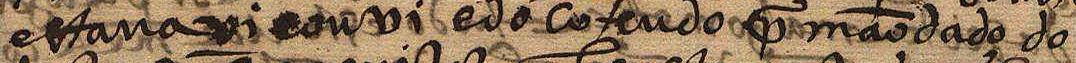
estaua vi e ouvi e do c̄oteudo p̄o mãodado do
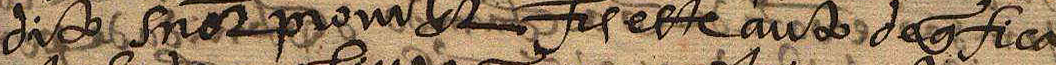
dito snōr prouizor fis este auto de q̄ fica
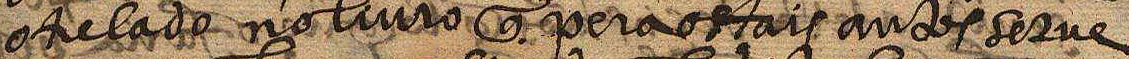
o trelado no liuro q̄ pera os tais autos serue
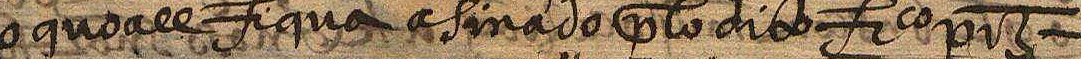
o quoall fiqua asinado p̄lo dito frco pīz
